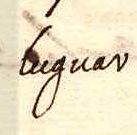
luguar
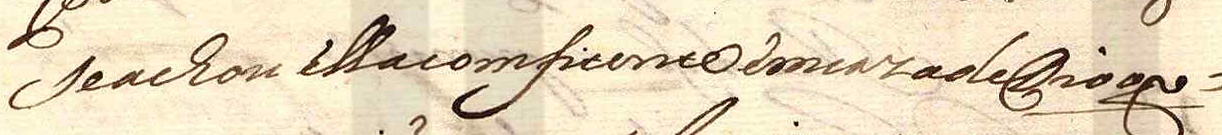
se achou ella comfitente em caza de Diogo
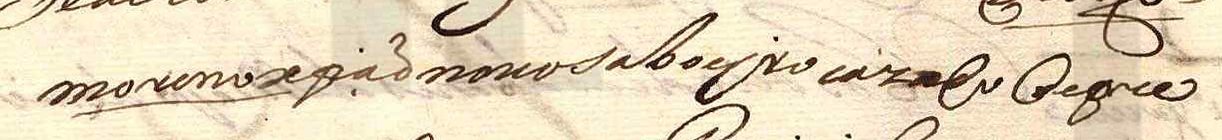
moreno xpaõ nouo saboejro cazado de pre
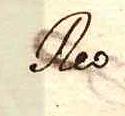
Reo
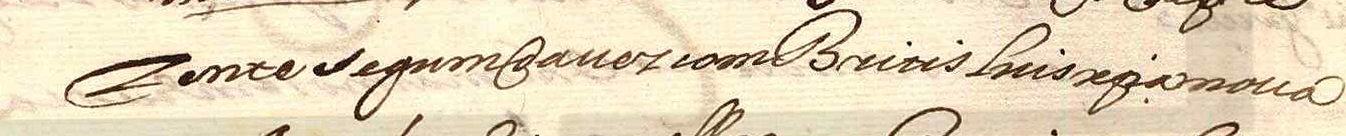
zente segumda uez com Britis Luis xpa noua
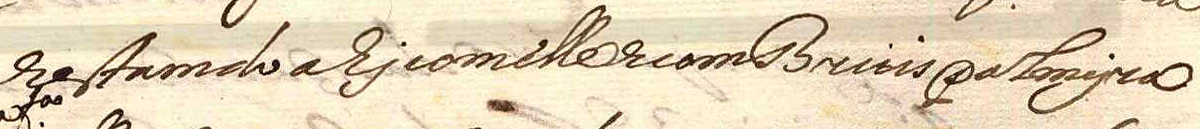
E estamdo ahj com elle E com Britis palmejra
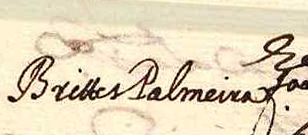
Brittes Palmeira f.a
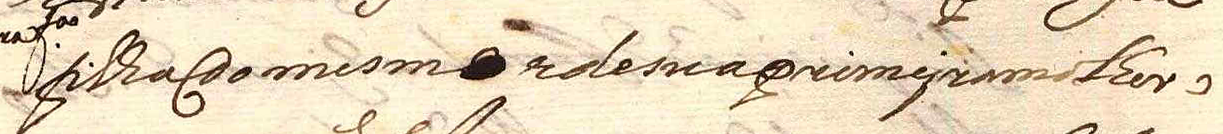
filha do mesmo E de sua primejra molher
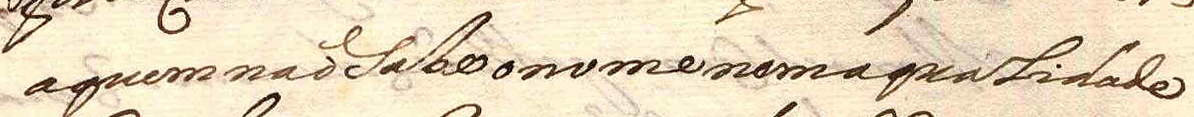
a quem naõ sabe o nome nem a qualidade
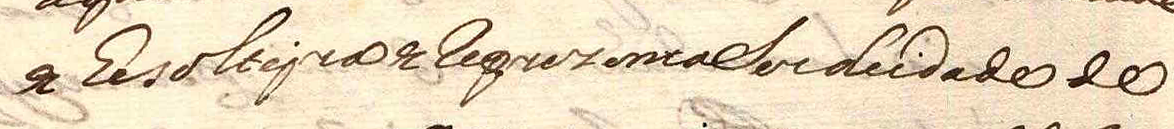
E he soltejra E Reprezenta Ser de idade de
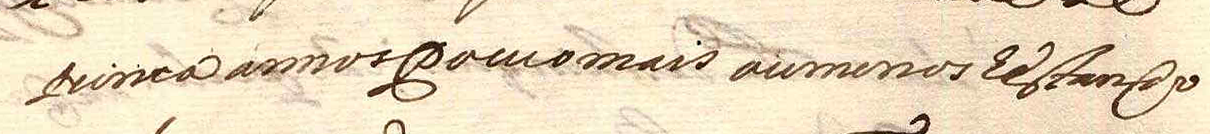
trinta annos pouco mais ou menos E estando
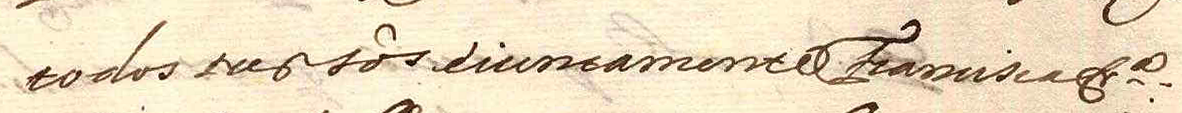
todos tres sós e iuntamente Francisca fr.a
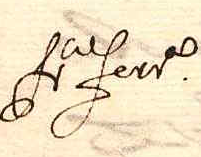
frca ferr.a
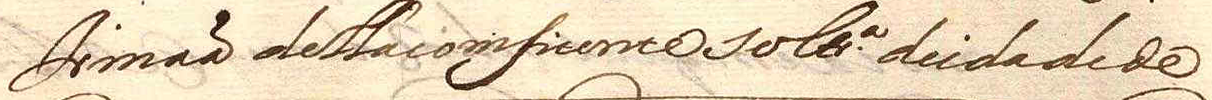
Jrmaā della comfitente soltr.a de idade de
